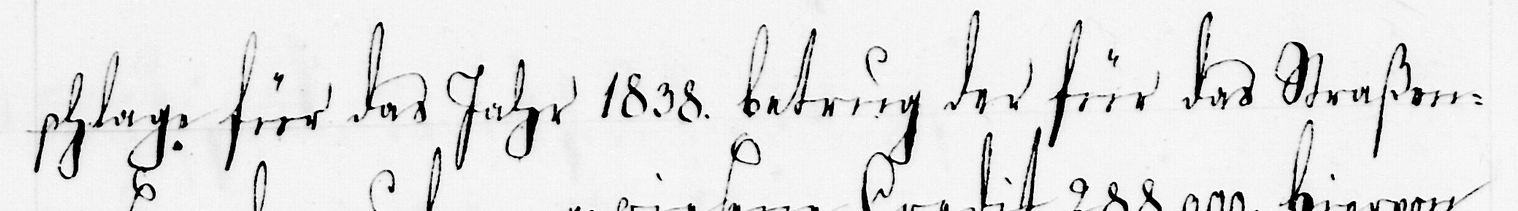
schlage für das Jahr 1838. betrug der für das Straßen¬
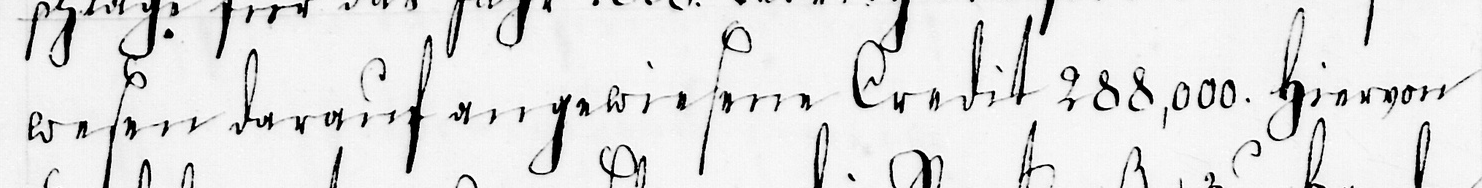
wesen darauf angewiesene Credit 288,000. Hiervon
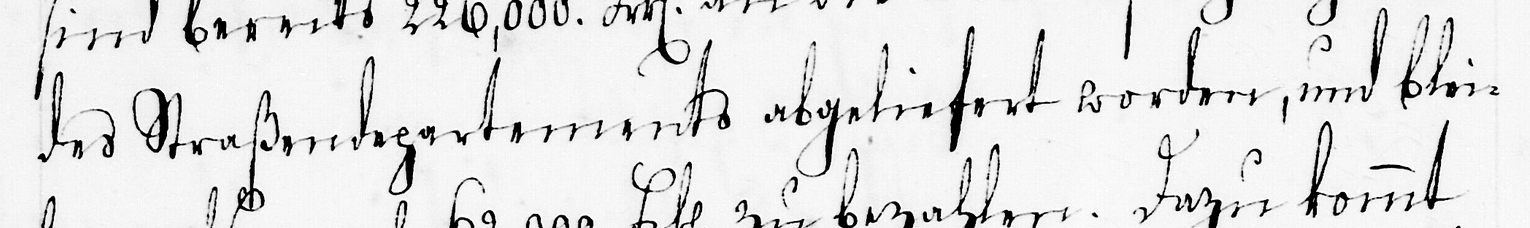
des Straßendepartements abgeliefert worden, und blei¬
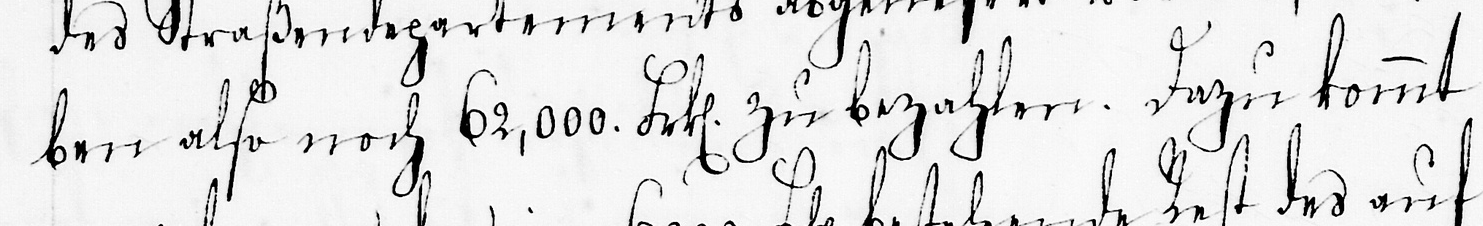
ben also noch 62,000. Frk[en]. zu bezahlen. Dazu kommt
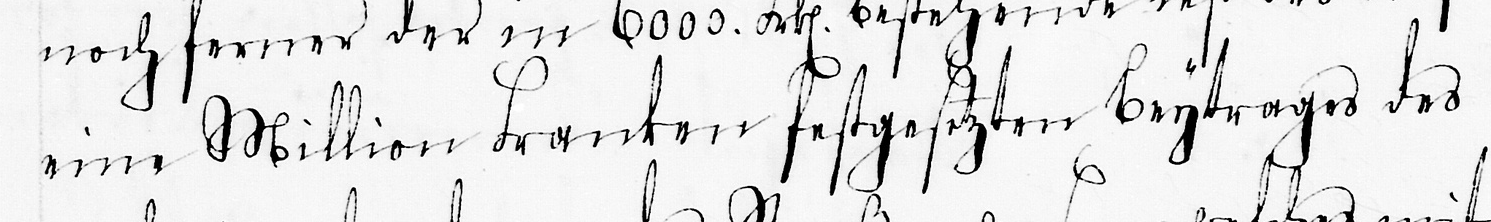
eine Million Franken festgesetzten Beytrages des
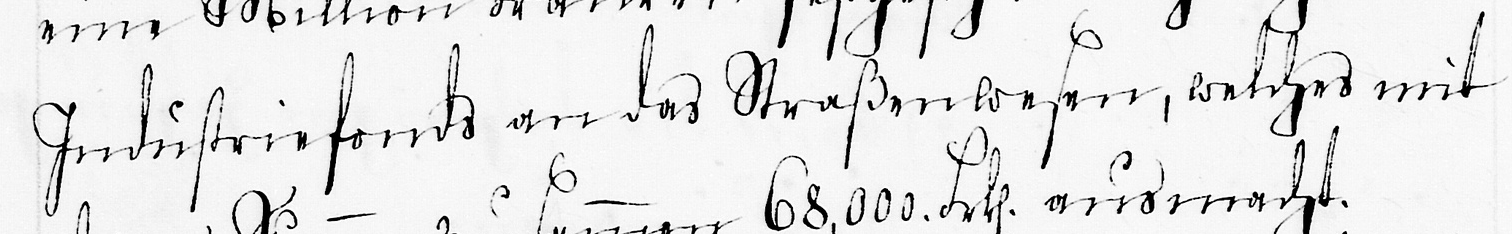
Industriefonds an das Straßenwesen, welches mit
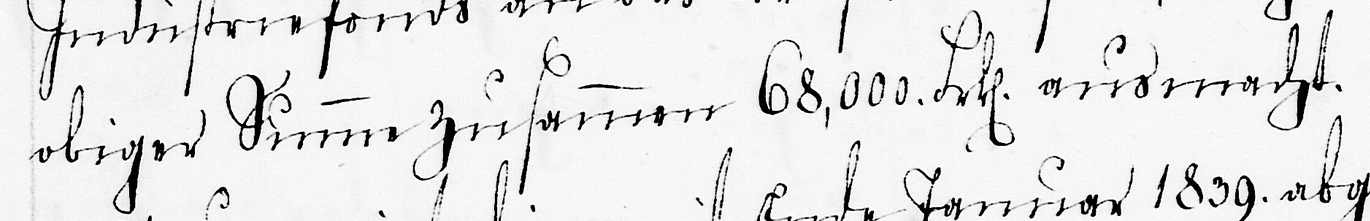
obiger Summe zusammen 68,000. Frk[en]. ausmacht.
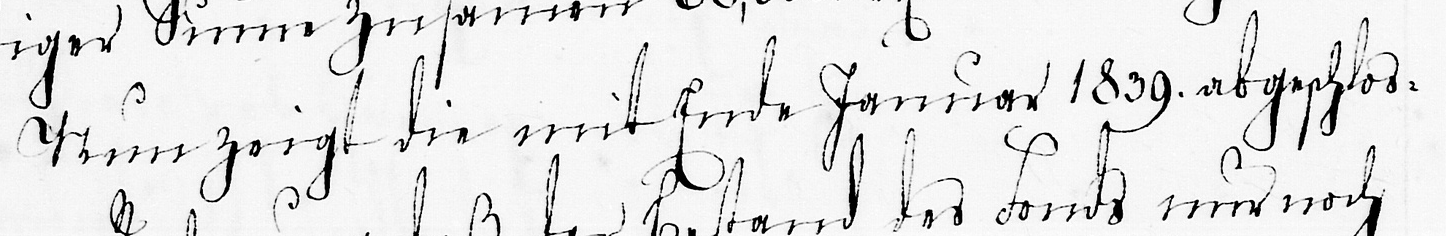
Nun zeigt die mit Ende Januar 1839. abgeschlo¬
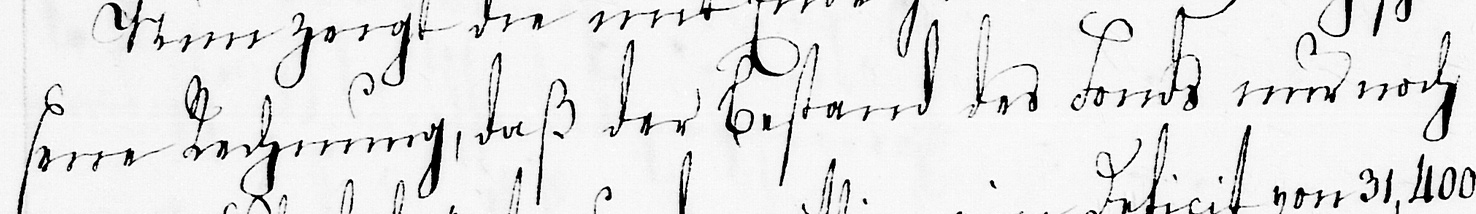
ßene Rechnung, daß der Bestand des Fonds nur noch
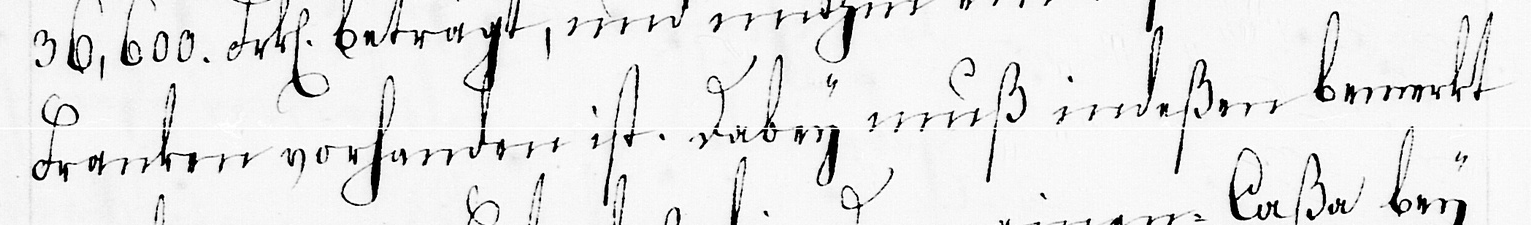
Franken vorhanden ist. Dabey muß indeßen bemerkt
